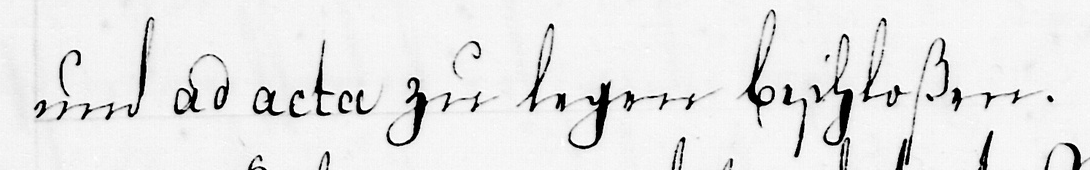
und ad acta zu legen beschloßen.
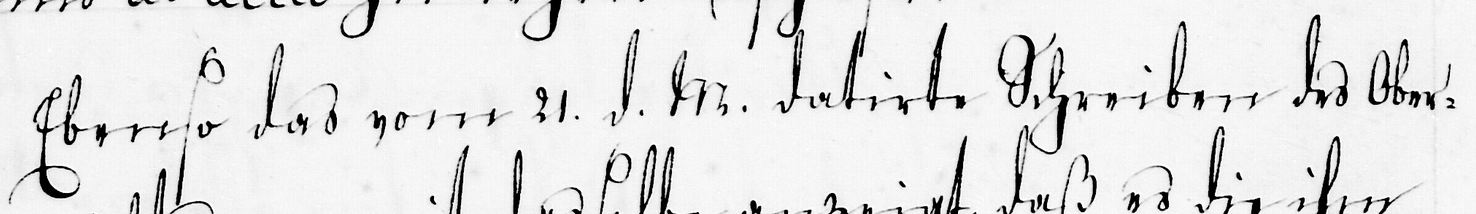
Ebenso das vom 21. d. M. datirte Schreiben des Ober¬
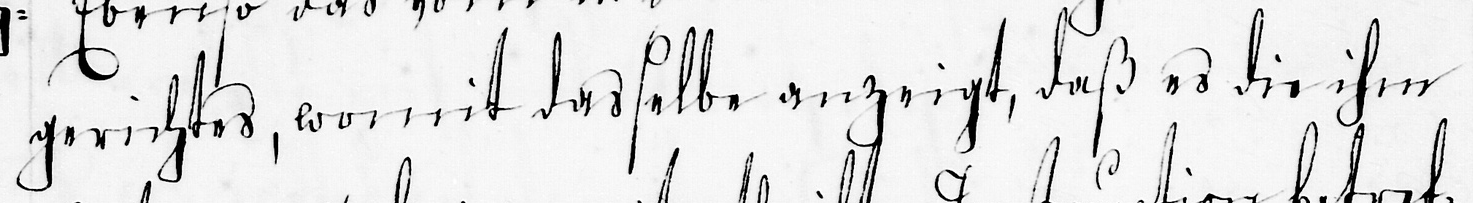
gerichtes, womit dasselbe anzeigt, daß es die ihm
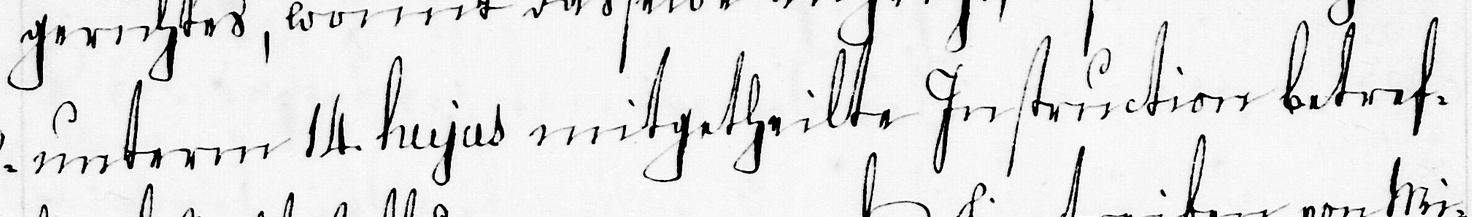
unterm 14. hujus mitgetheilte Instruction betref¬
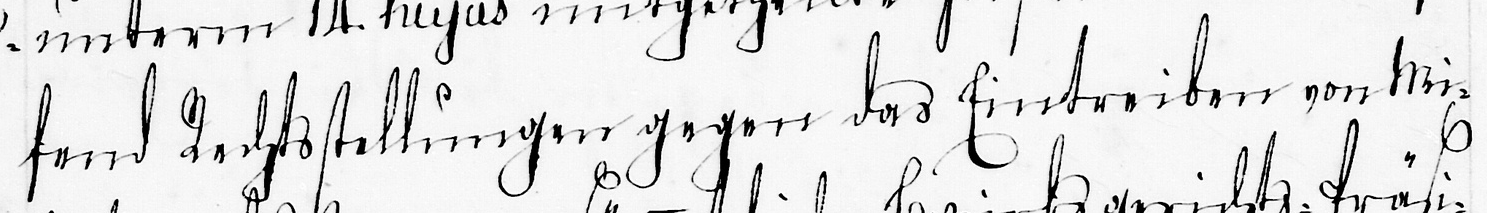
fend Rechtsstellungen gegen das Eintreiben von Mi¬
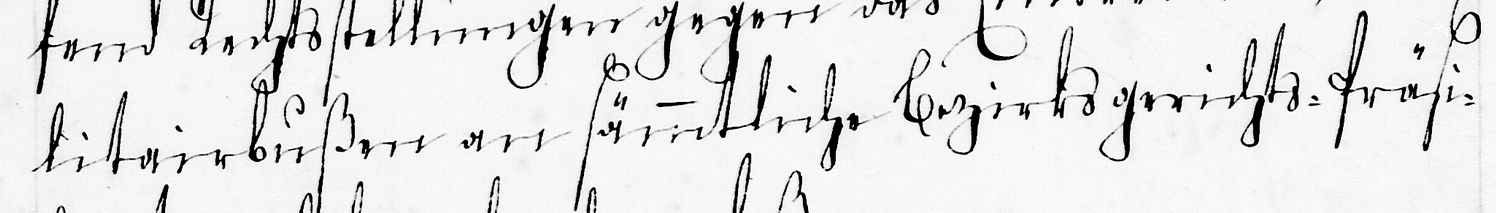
litairbußen an sämmtliche Bezirksgerichts-Präsi¬
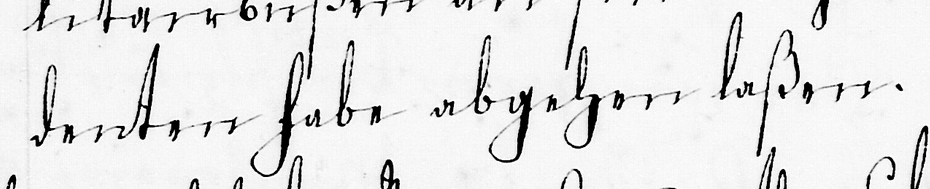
denten habe abgehen laßen.
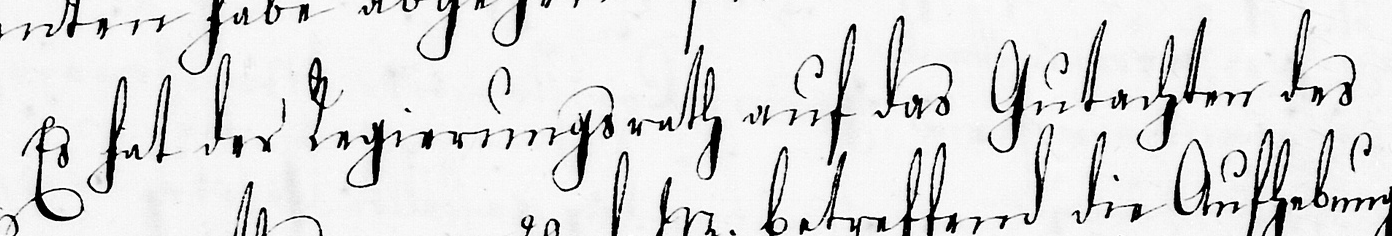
Es hat der Regierungsrath auf das Gutachten des
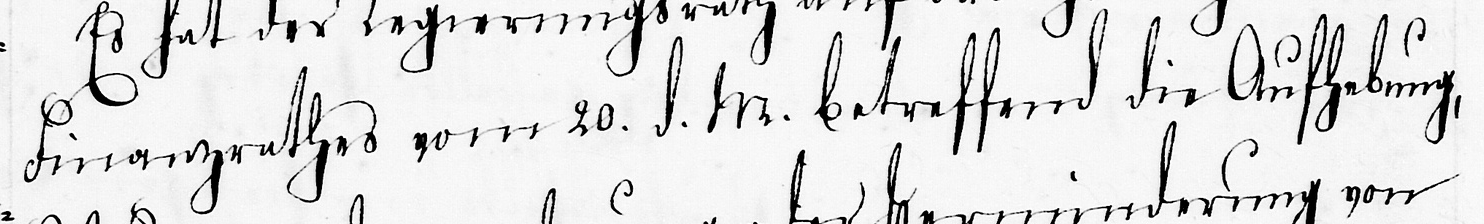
Finanzrathes vom 20. d. M. betreffend die Aufhebung,
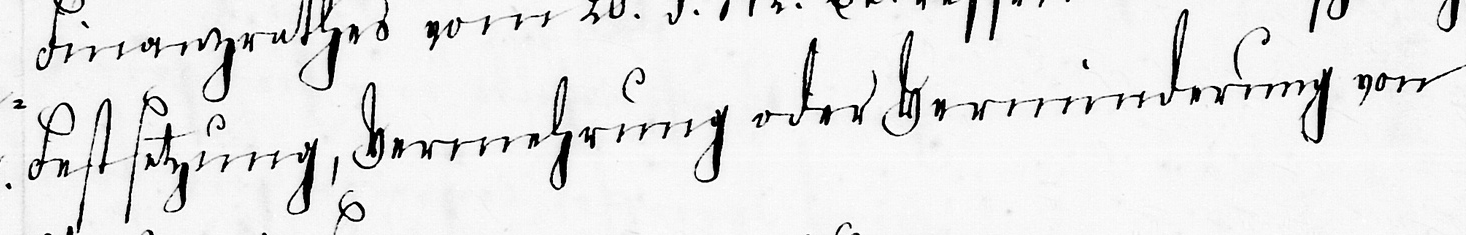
Festsetzung, Vermehrung oder Verminderung von
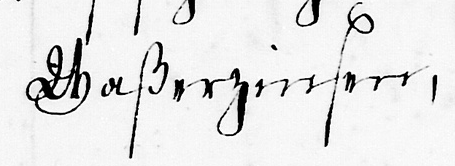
Waßerzinsen,
